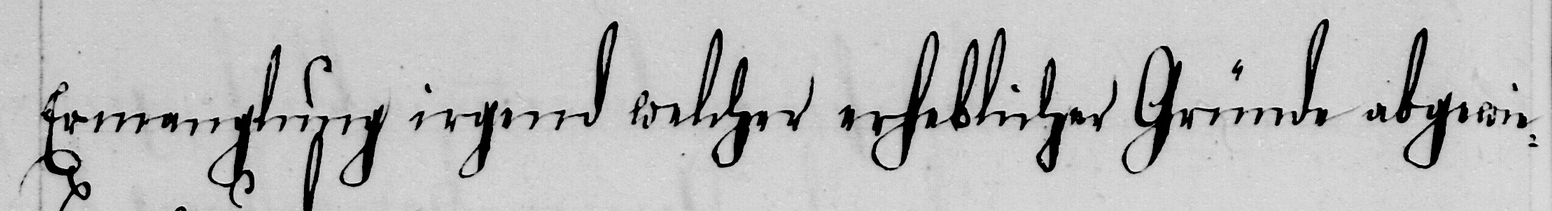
Ermangelung irgend welcher erheblicher Gründe abgewi¬
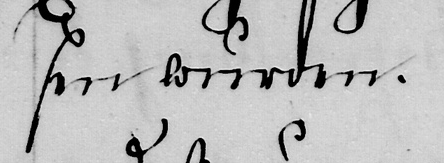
esen wurden.
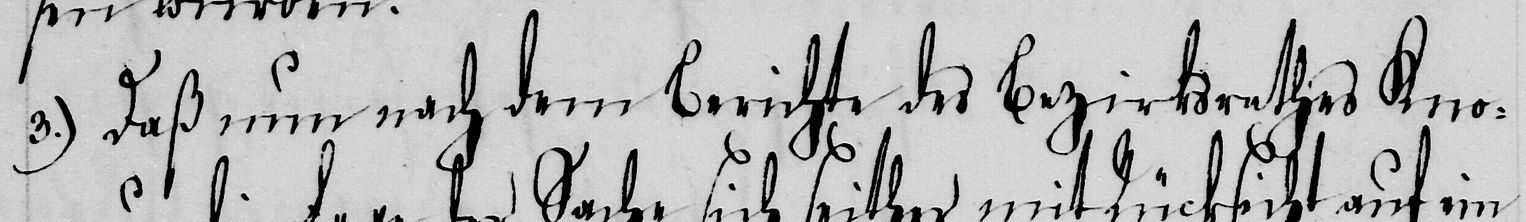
3.) Daß nun nach dem Berichte des Bezirksrathes Kno¬
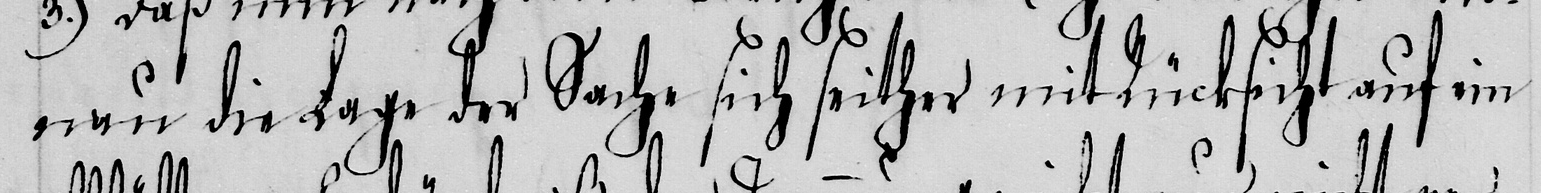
nau die Lage der Sache sich seither mit Rücksicht auf ein
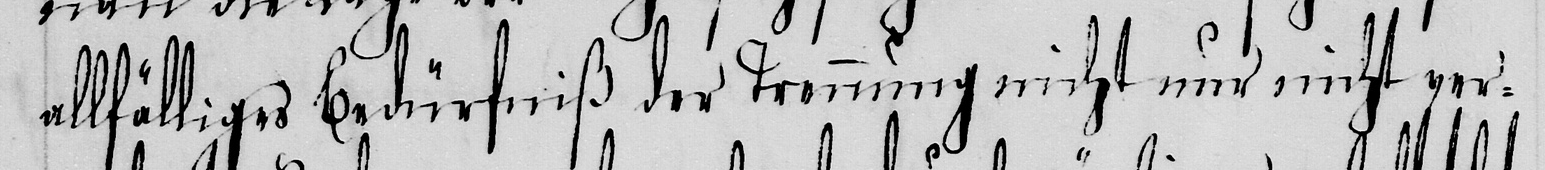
allfälliges Bedürfniß der Trennung nicht nur nicht ver¬
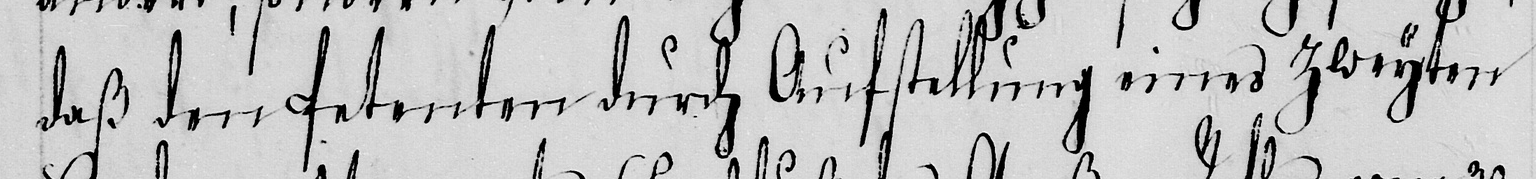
daß den Petenten durch Aufstellung eines zweyten
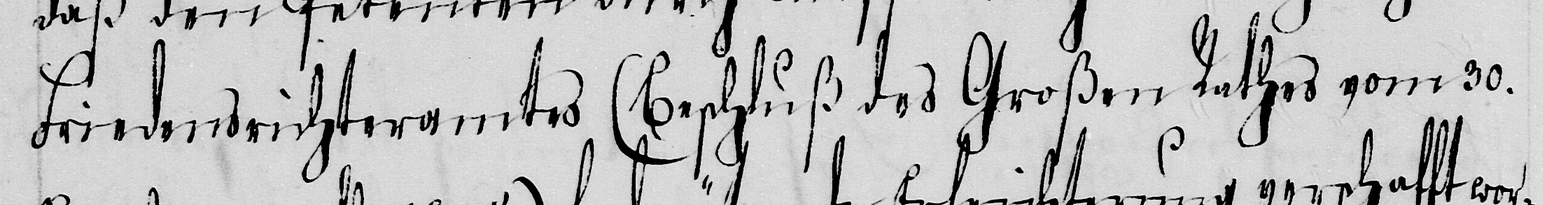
Friedensrichteramtes (Beschluß des Großen Rathes vom 30.
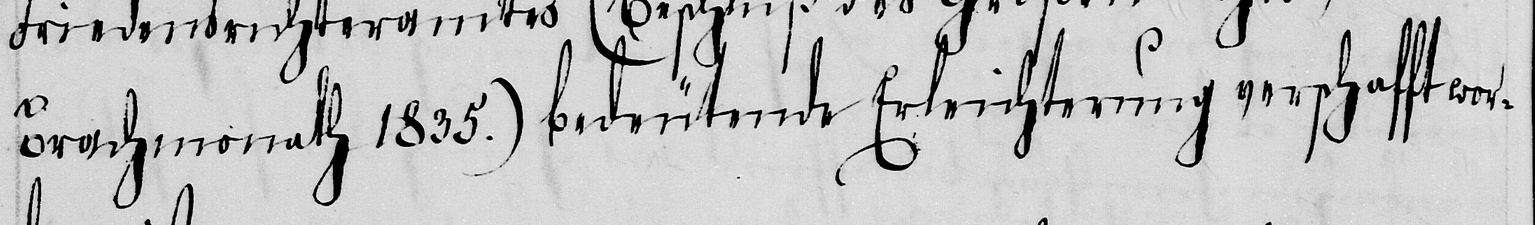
Brachmonath 1835.) bedeutende Erleichterung verschafft wo¬
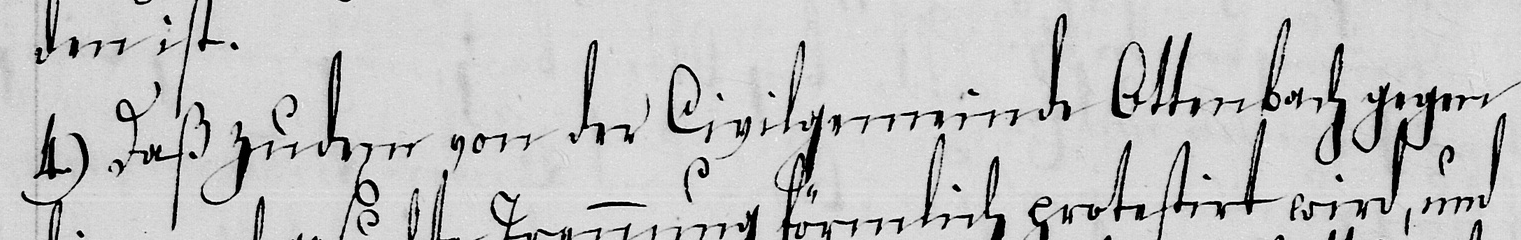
4.) Daß zudem von der Civilgemeinde Ottenbach gegen
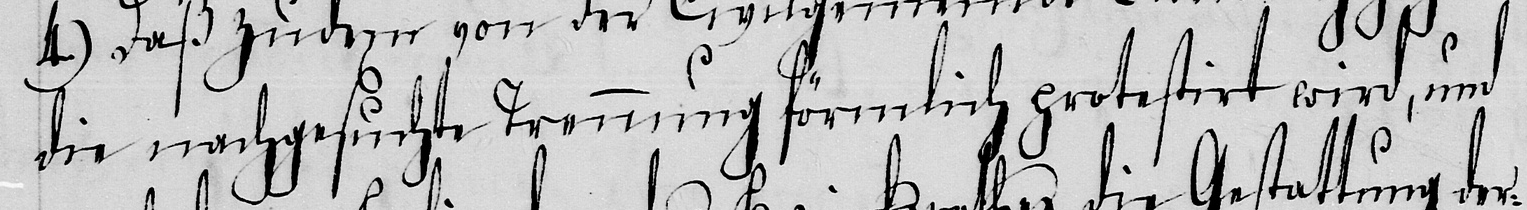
die nachgesuchte Trennung förmlich protestirt wird, und
